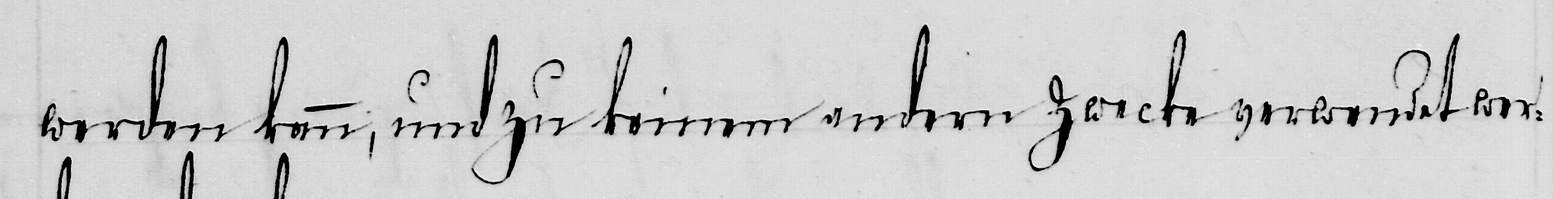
werden kann, und zu keinem andern Zwecke verwendet we¬
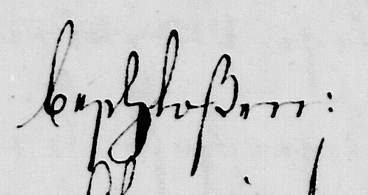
beschloßen:
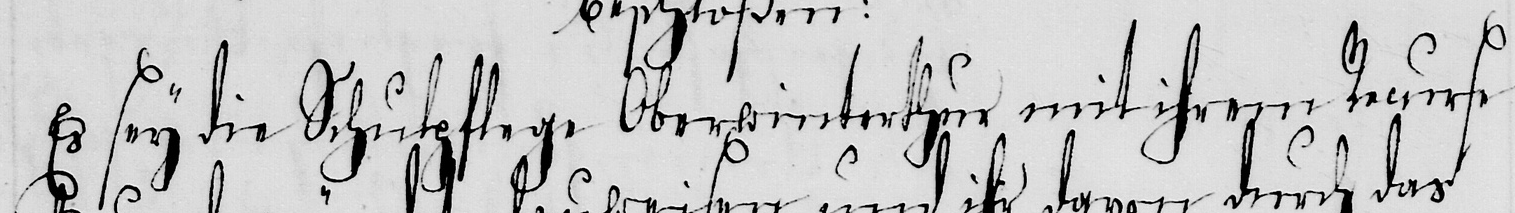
Es sey die Schulpflege Oberwinterthur mit ihrem Recurse
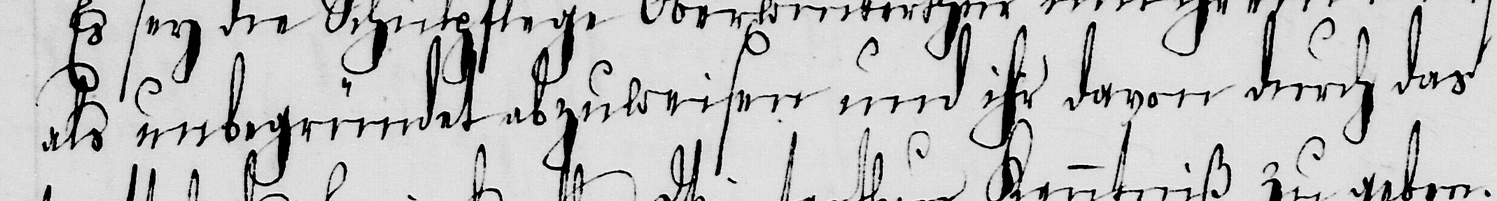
als unbegründet abzuweisen und ihr davon durch das
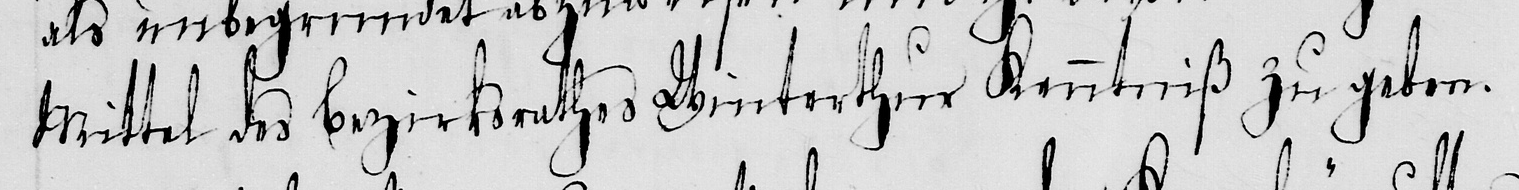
Mittel des Bezirksrathes Winterthur Kenntniß zu geben.
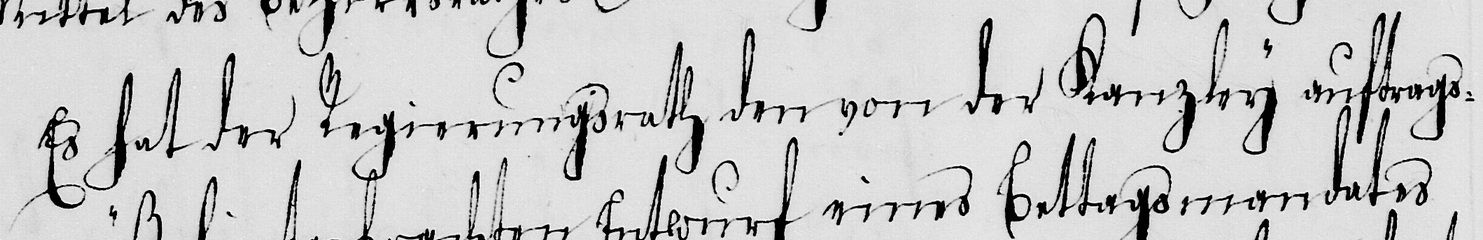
Es hat der Regierungsrath den von der Kanzley auftrag¬
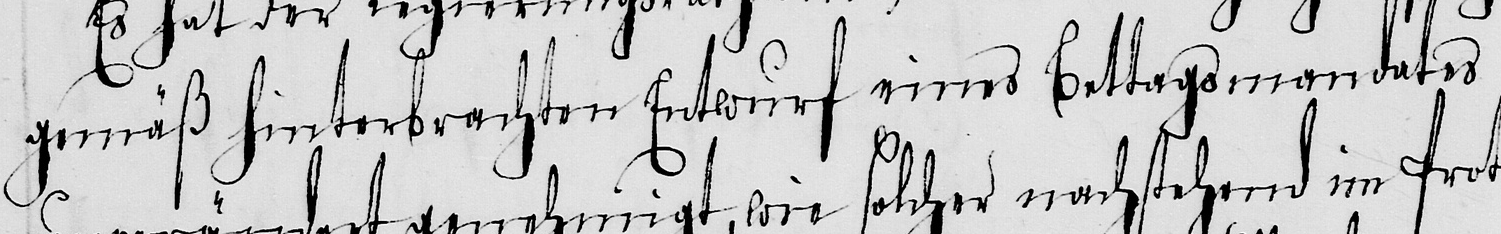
sgemäß hinterbrachten Entwurf eines Bettagsmandates
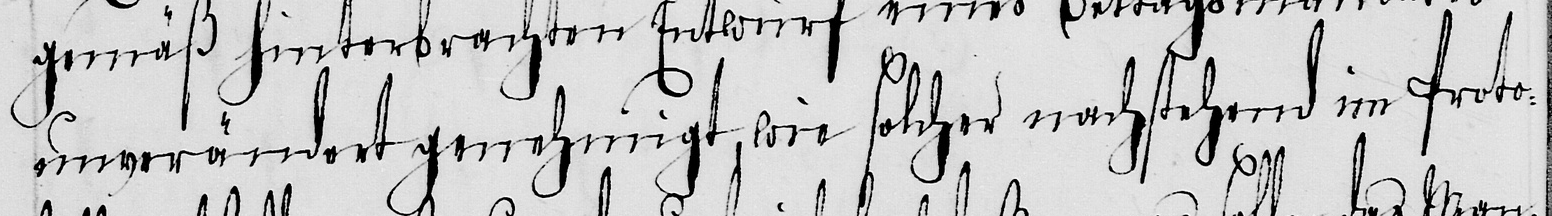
unverändert genehmigt, wie solcher nachstehend im Proto¬
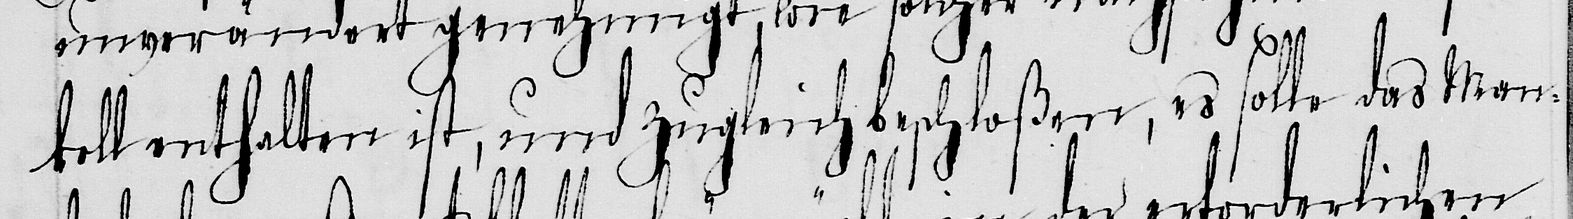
koll enthalten ist, und zugleich beschloßen, es solle das Man¬
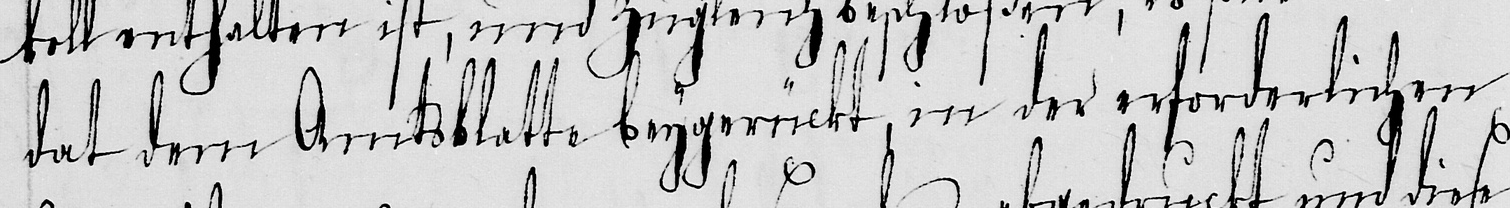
dat dem Amtsblatte beygerückt, in der erforderlichen
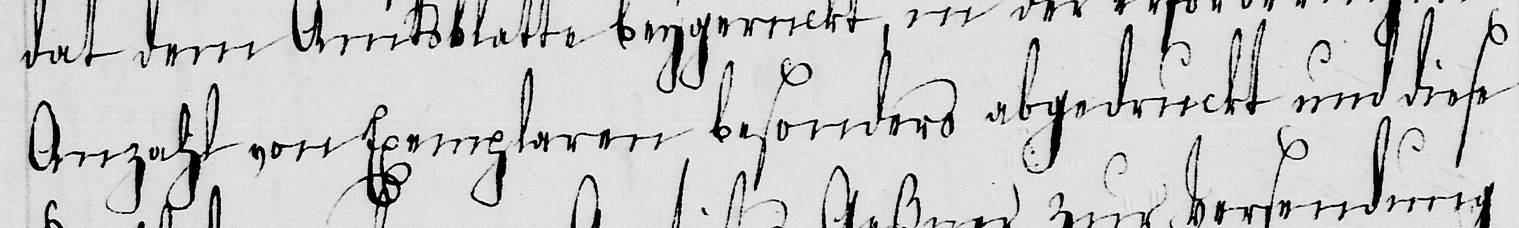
Anzahl von Exemplaren besonders abgedruckt und diese
